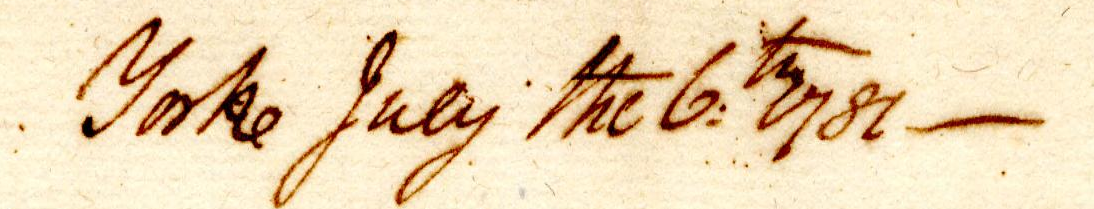Yorke July the 6^th. 1781
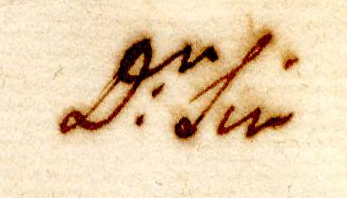D^r. Sir
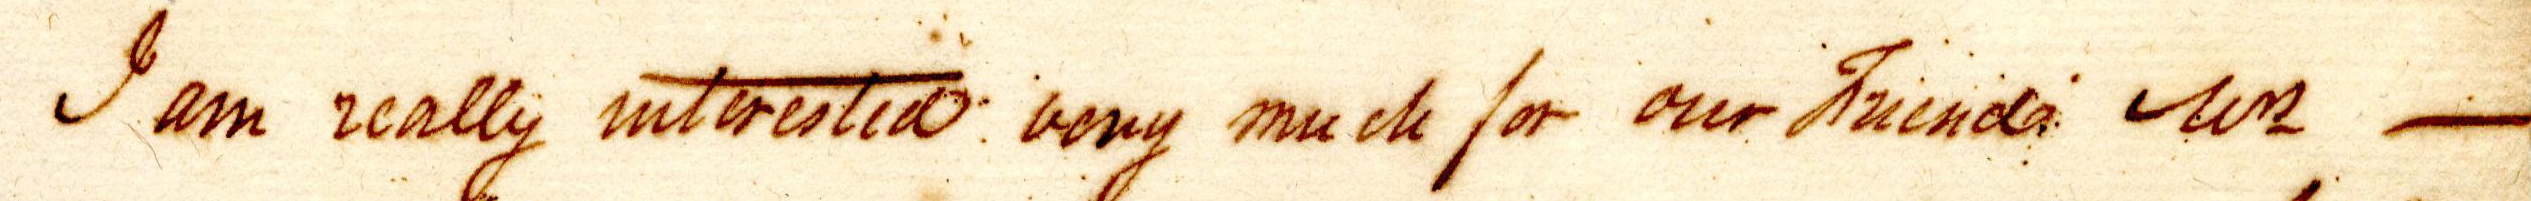I am really interested very much for our Friend M^rs
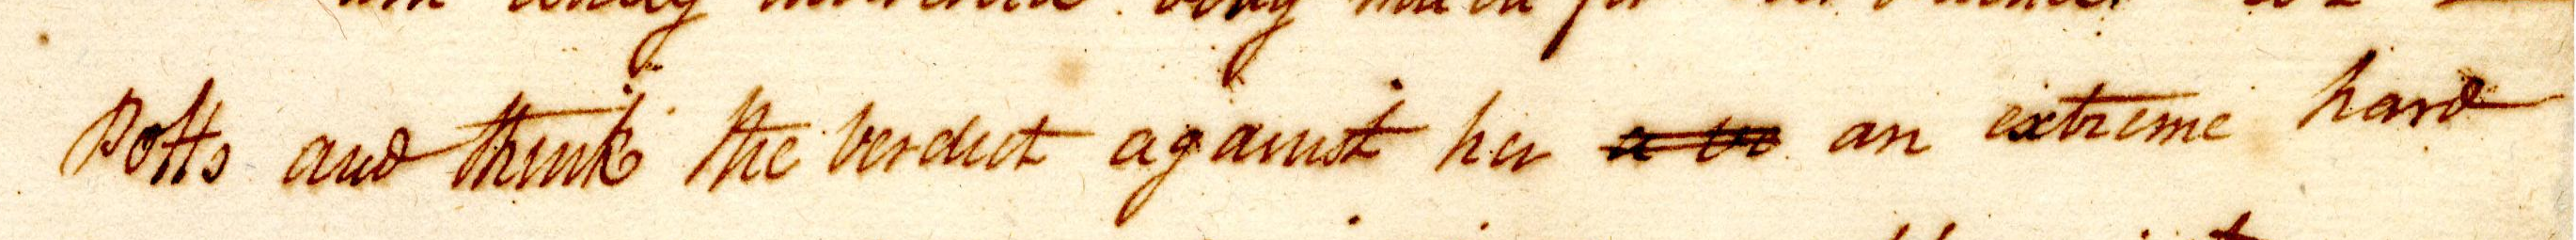Potts and think the verdict against her a wo an extreme hard
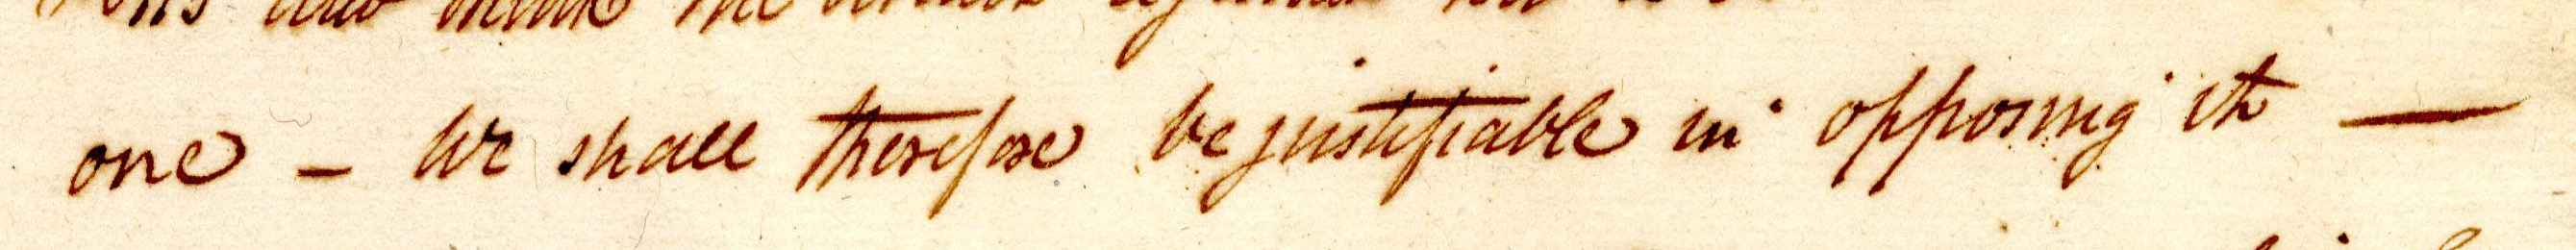one. We shall therefore be justifiable in opposing it
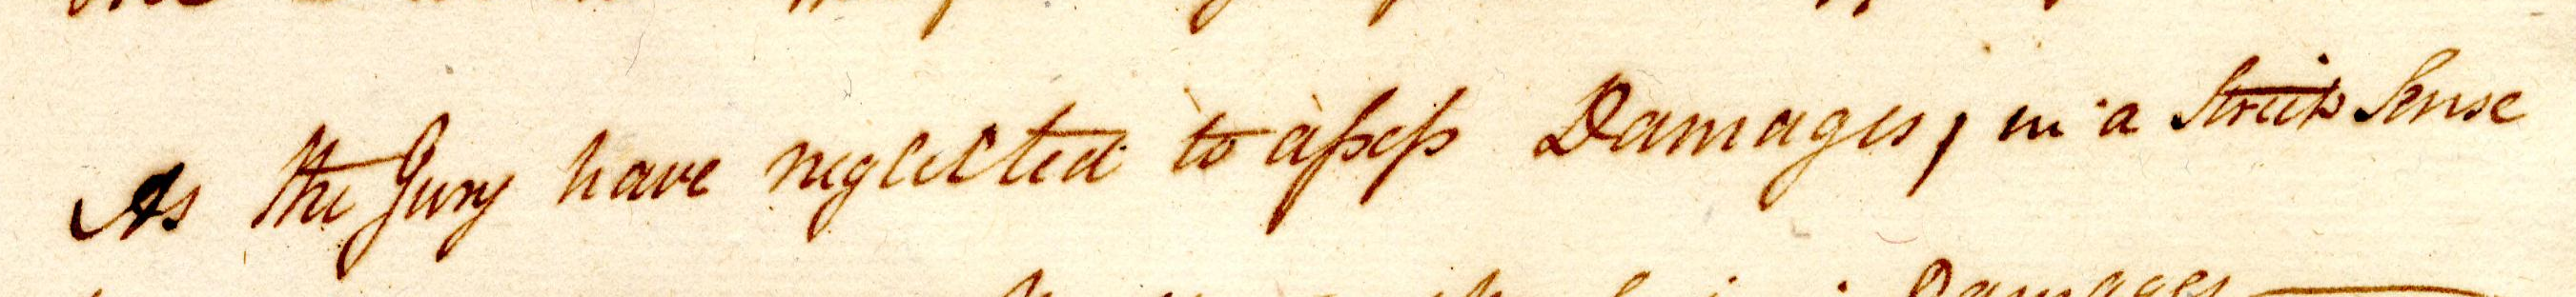As the Jury have neglected to assess Damages, in a Strict Sense
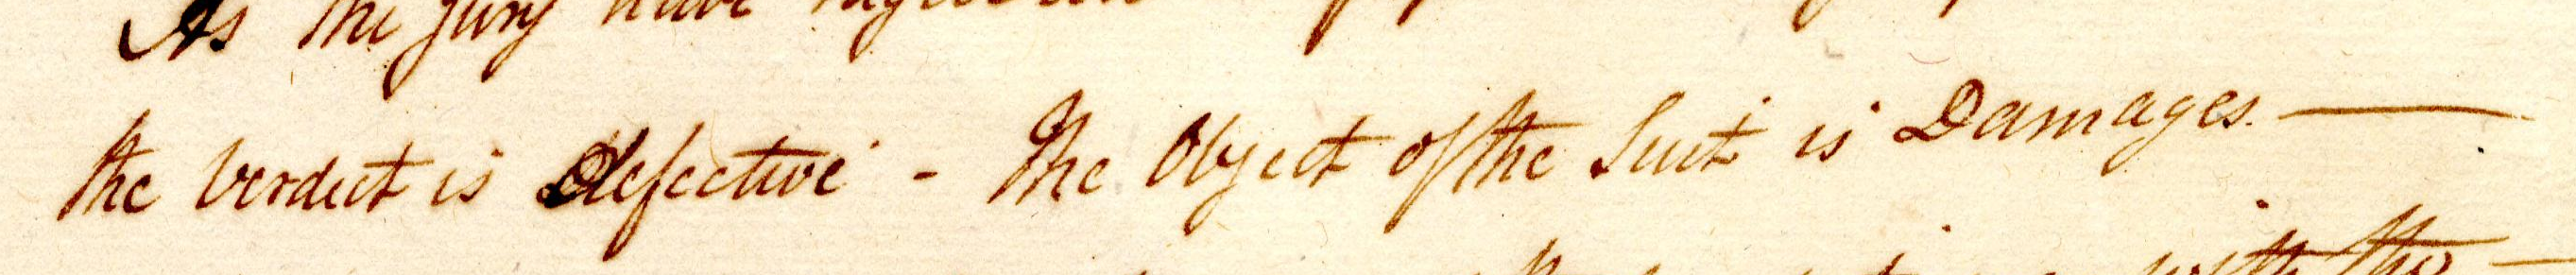the verdict is defective. The Object of the Suit is Damages
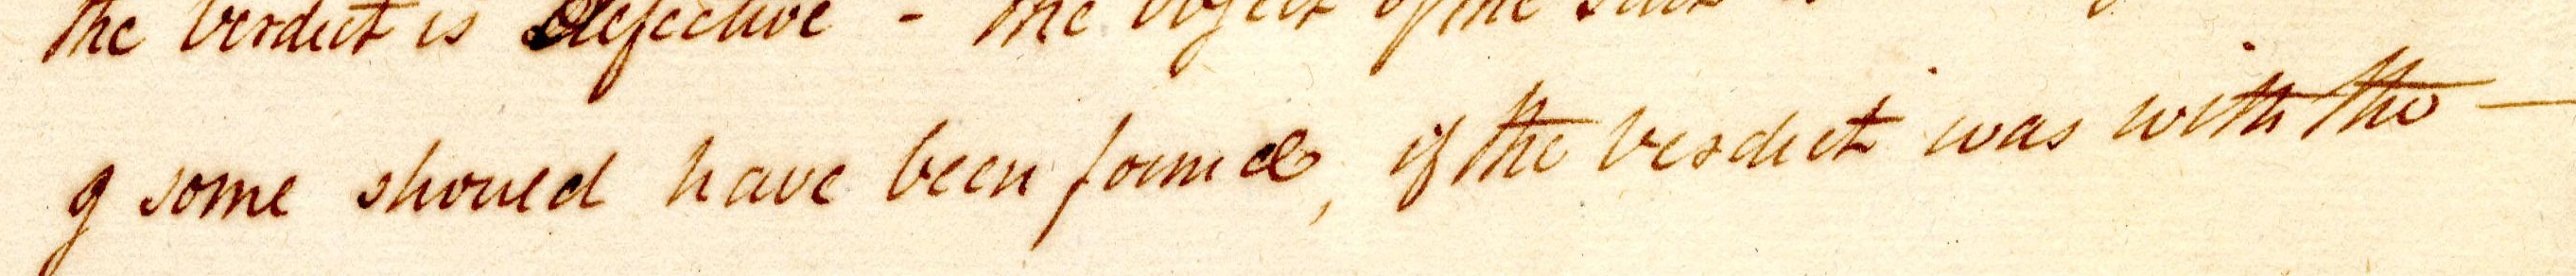& some should have been formd if the verdict was with the
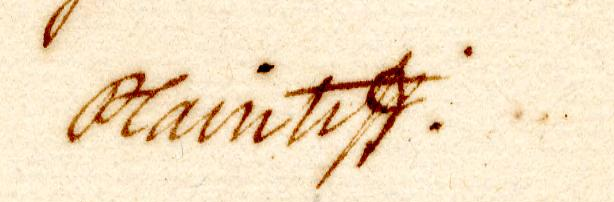Plaintiff.
